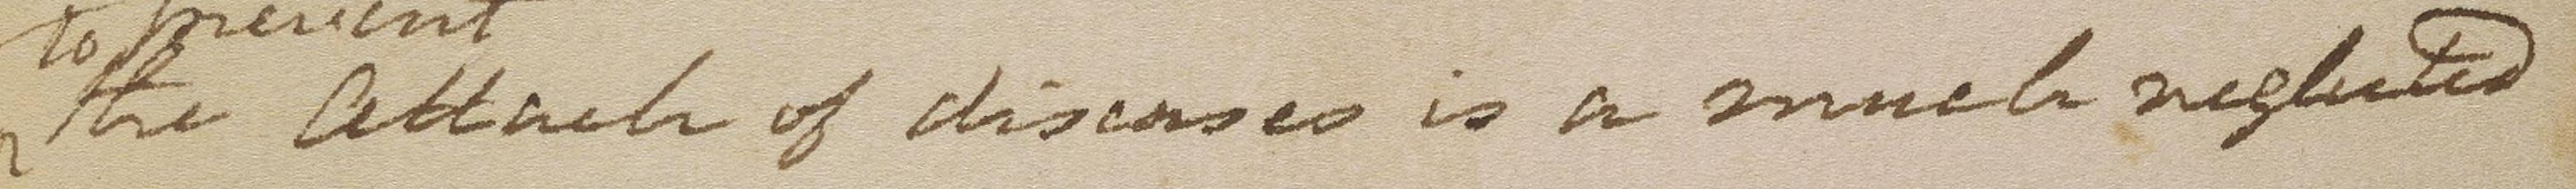^ the Attack of diseases is a much neglected
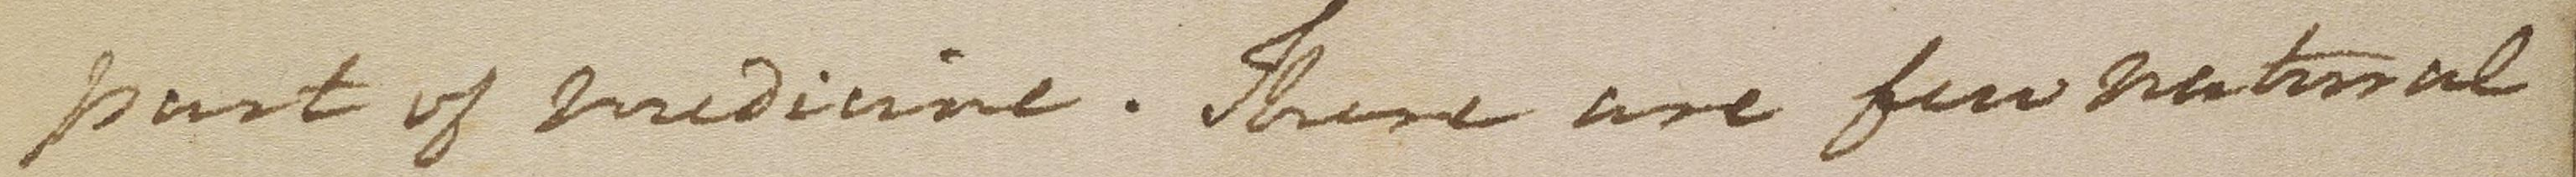part of medicine. There are few natural
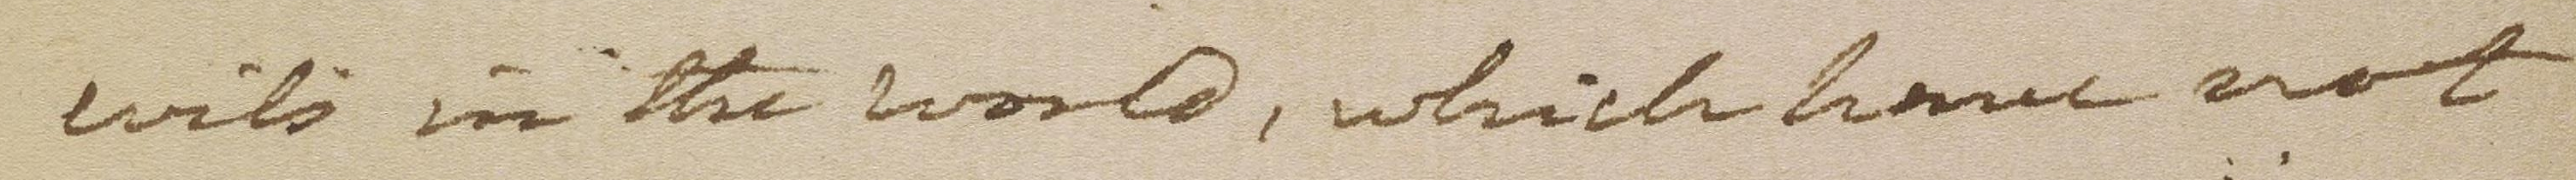evils in the world, which have not
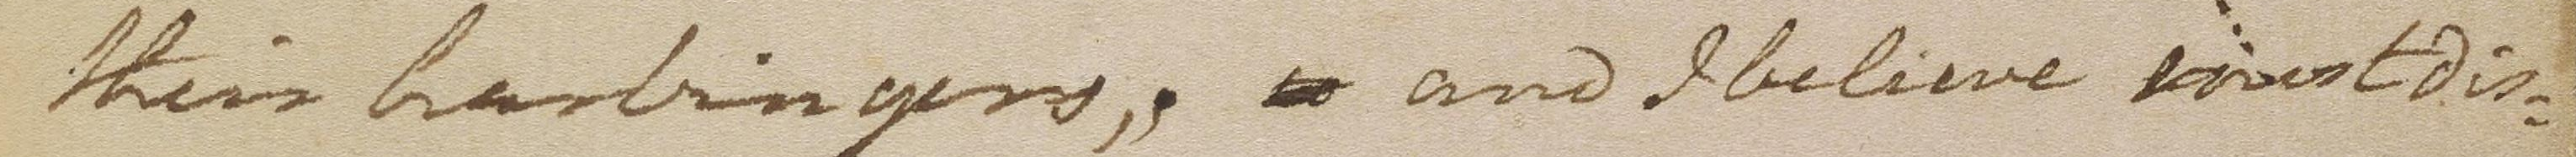their harbingers, [so] and I believe most dis-
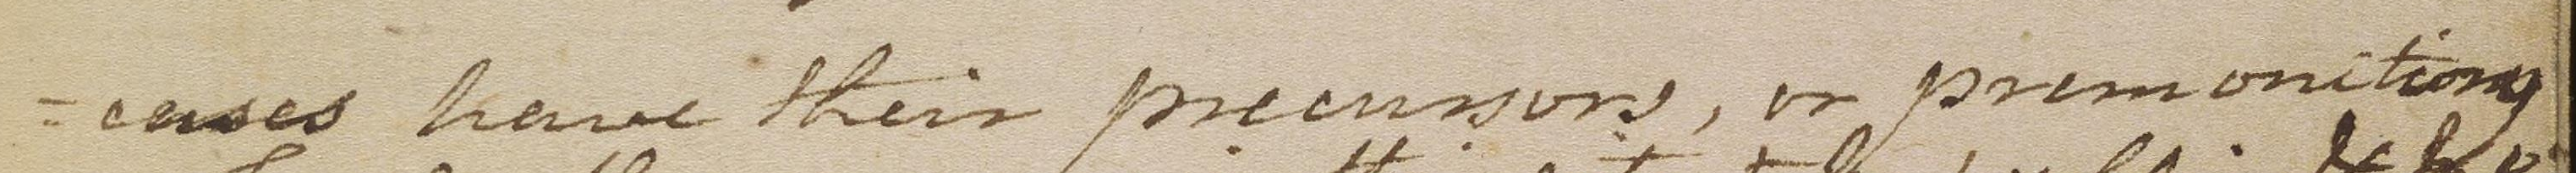-eases have their preursors, or premonitory
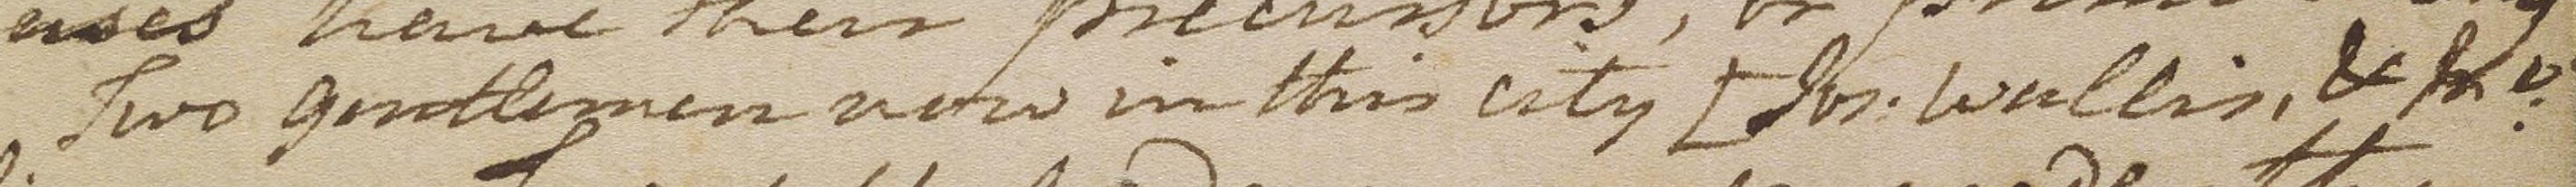Two gentlemen now in this city (Jos. Wallis & [&c:]
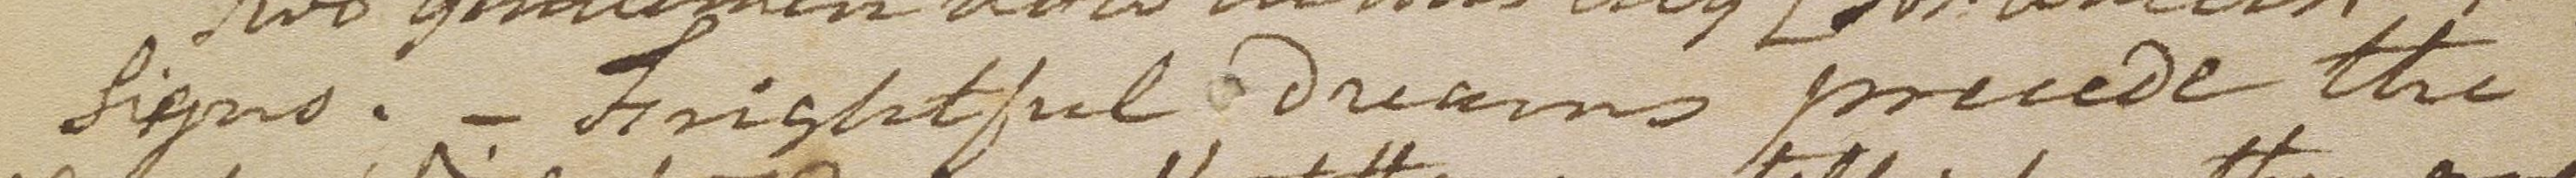Signs.- Frightful dreams precede the
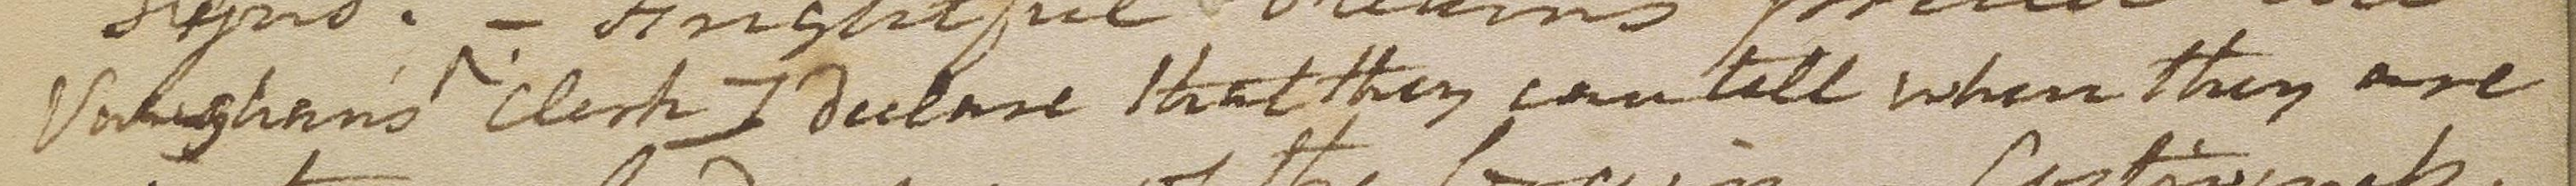Vaughan's Clerk) delcare that they can tell when they are
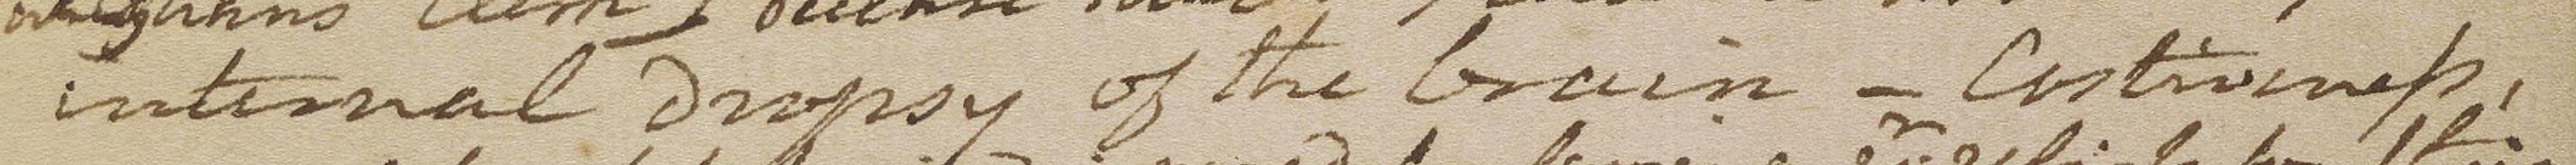internal Dropsy of the brain, Costiness,
